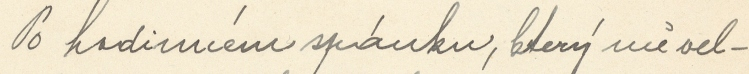Po hodinném spánku, který mě vel-
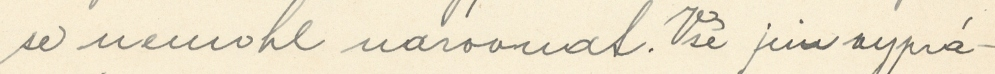se nemohl narovnat. Vše jim vyprá-
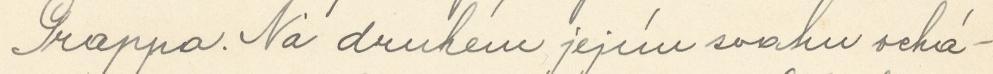Grappa. Na druhém jejím svahu schá-
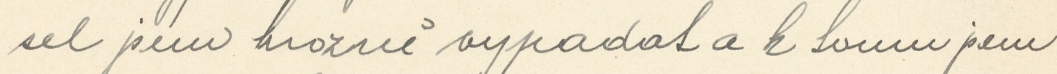sel jsem hrozně vypadat a k tomu jsem
